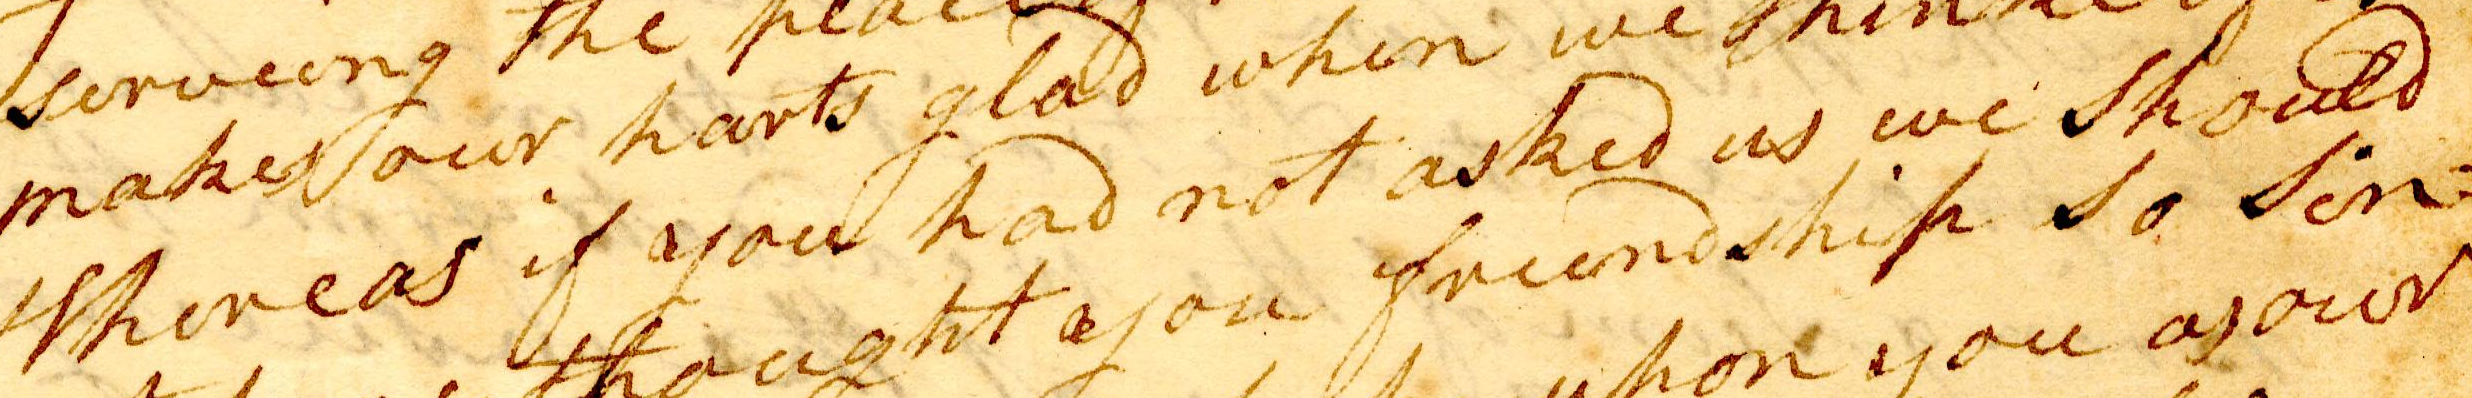Thereas if you had not asked us we should
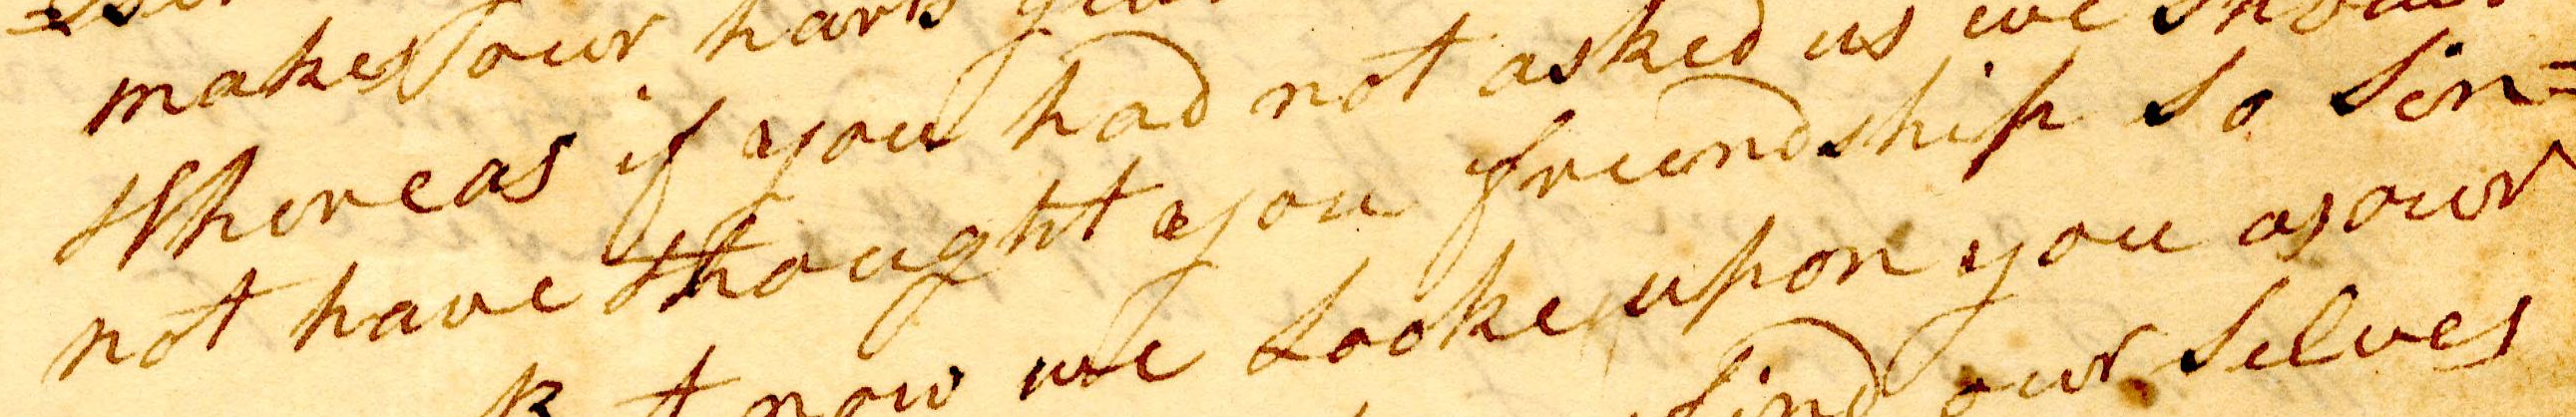not have thought you friendship so Sin-
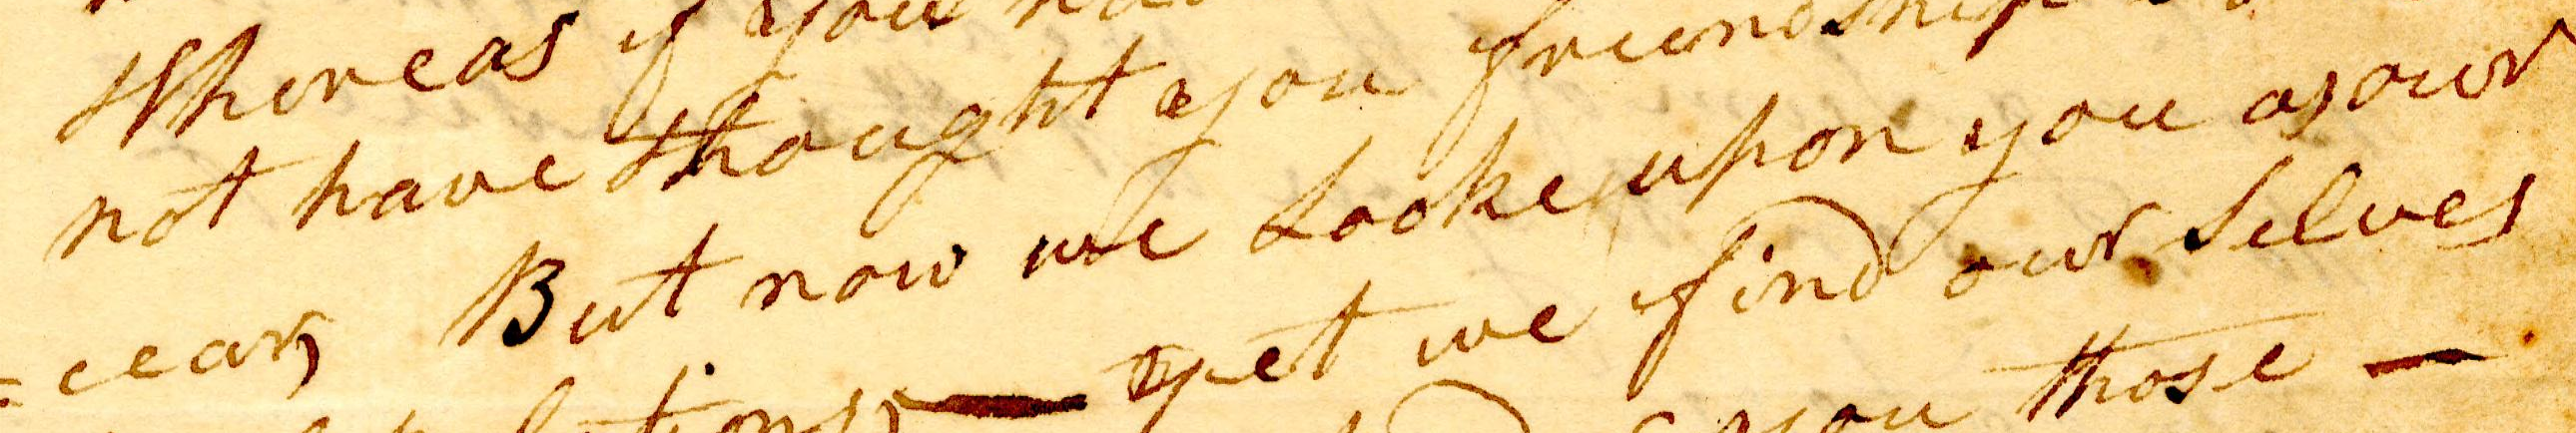-cear, But now we Looke upon you as our
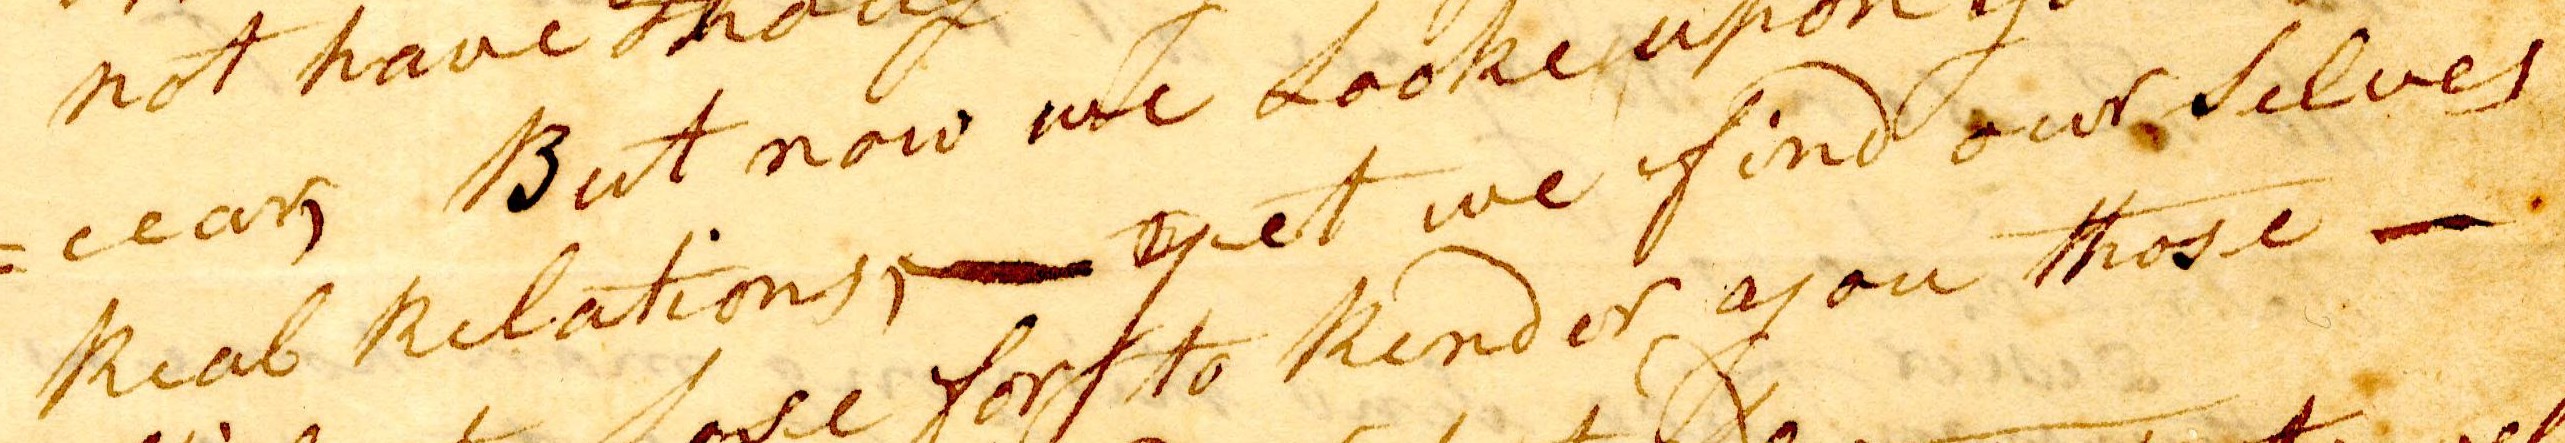Real Relations,- yet we find our Selves
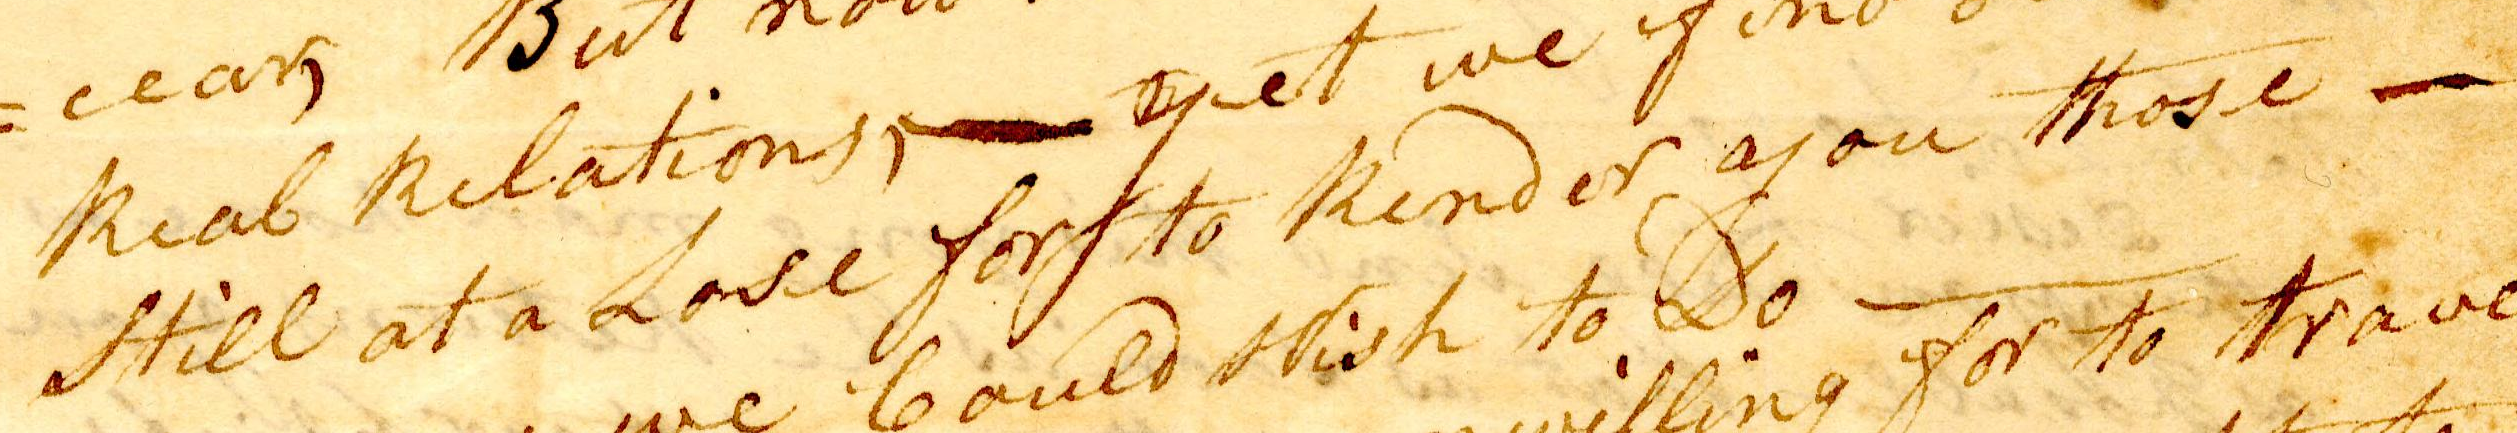Still at a Lose for to Render, you those-
